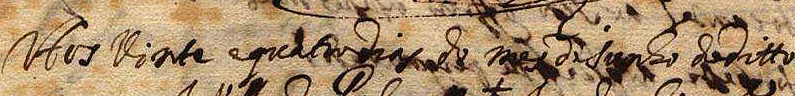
Aos Vinte e quatro dias do mes de Iunho do ditto
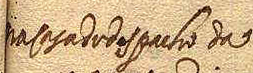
na casa do despacho da
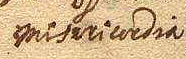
misericordia
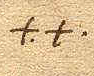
+. +.
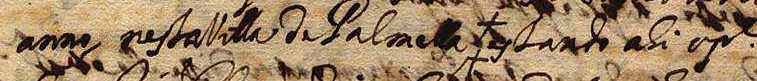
anno, nesta Villa de Palmella + estando ahi o pe.
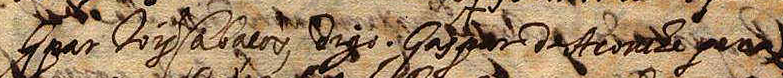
Gpar Roiz̄ Cabaços, digo. Gaspar de Arouche pera
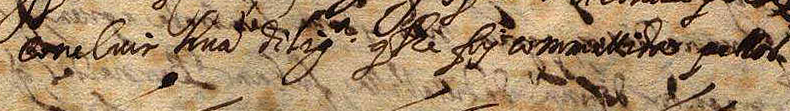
concluir huā diliga. q̄ lhe foy commettida pellos
